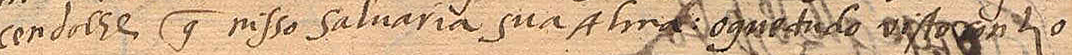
cendolhe q̄ nisso Saluaria sua Alma: o que tudo visto con ho
